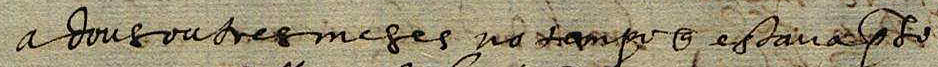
a dous ou tres meses no tempo q̄ estaua p̄so
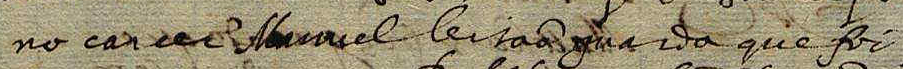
no carcer Manuel leitaõ guarda que foi
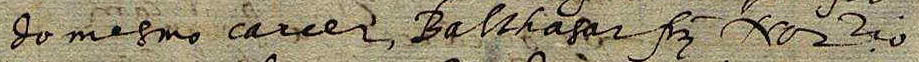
do mesmo carcer, Balthasar frz̄ Notrio
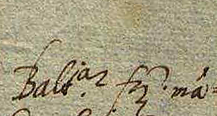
Balt.ar frz̄ mā
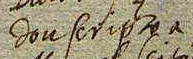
dou scripto a
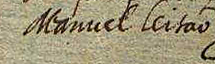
Manuel leitaõ
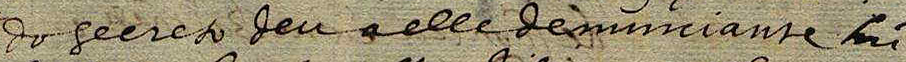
do secreto deu a elle denunciante hū
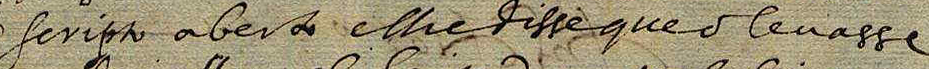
scripto aberto e lhe disse que o leuasse
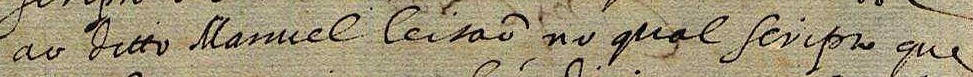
ao ditto Manuel leitaõ no qual scripto que
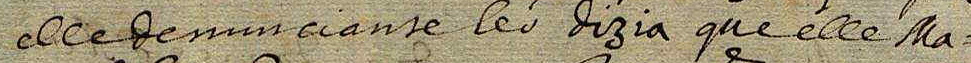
elle denunciante leo dizia que elle Ma
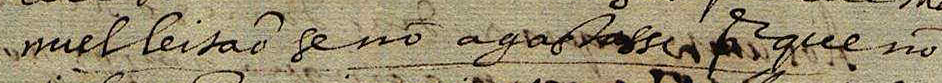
nuel leitaõ se nō agastasse porque nō
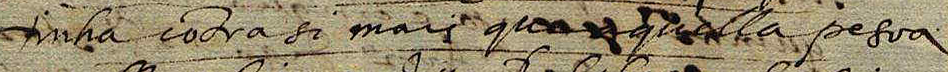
tinha cōtra si mais que aquella pesoa
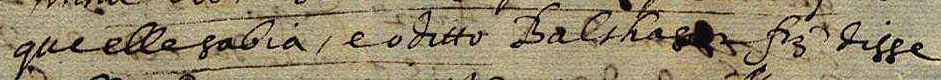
que elle sabia / e o ditto Balthasar frz̅ disse
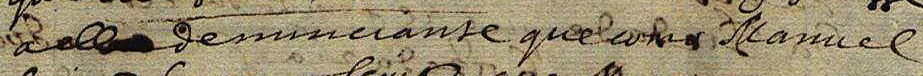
a ell_ denunciante que como Manuel
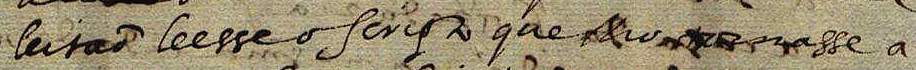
leitaõ leesse o scripto que lho tornasse a
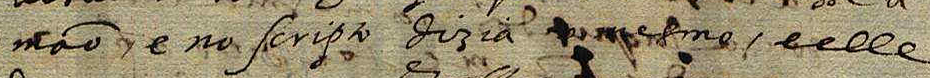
mão, e no scripto dizia o mesmo / e elle
